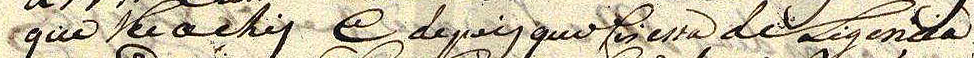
que lhe achej E depois que fis esta deLigencia
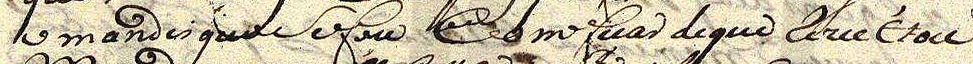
o mandei que se foce Comofeçar de que Rezultou
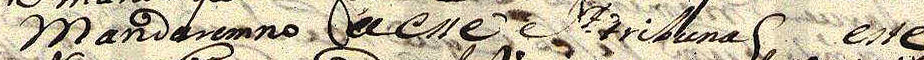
mandaremno a esse tribunal este
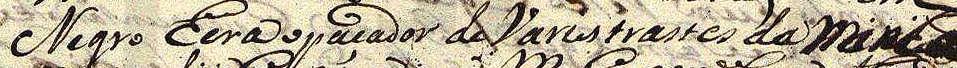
Negro hera o paçador de Varios trastes da minha
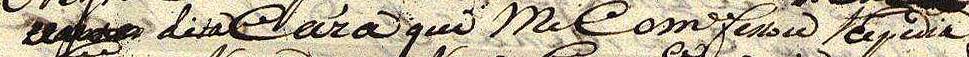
dita Caza que Me Comfessou lhe pedia
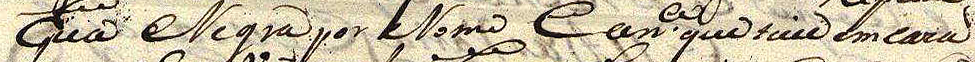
hua Negra por Nome Con.a que tiue em caza
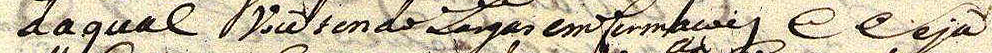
da qual Vou tendo Largas emfermaçois E Seja
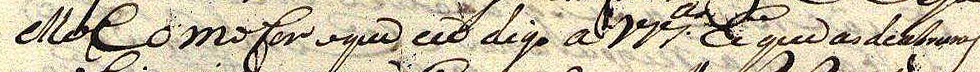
elle Como for o que eu digo a VV S.as he que as deabruras
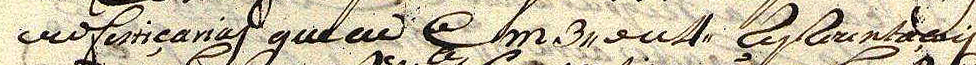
ou feitiçarias que eu Em 3// ou 4// RepRezentaçois
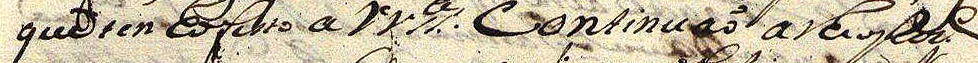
que tenho feito a VV. ss.as Continuaõ athe os pRez.e
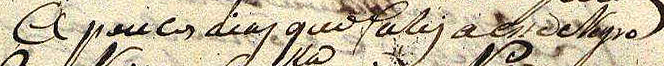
A poucos dias que falej a este Negro
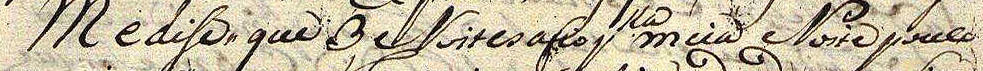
Me dise, que 3 Noites a fio p.lla meia Noite pouco
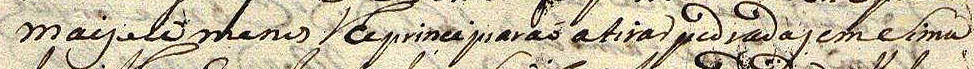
mais ou menos lhe principaraõ a tirar pedradas emSima
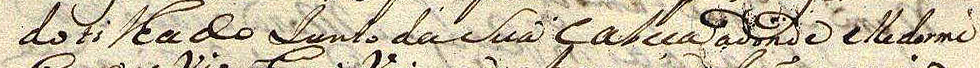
do tilhado Iunto da Sua Cabeça adonde elle dorme
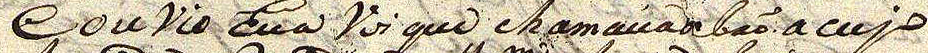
e ouvio hua Vos que chamaua Ioaõ a cujo
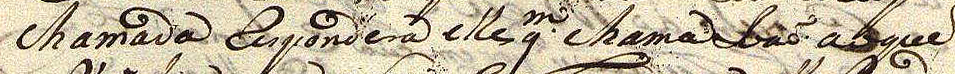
chamada Respondera elle q.m chama Ioaõ ao que
